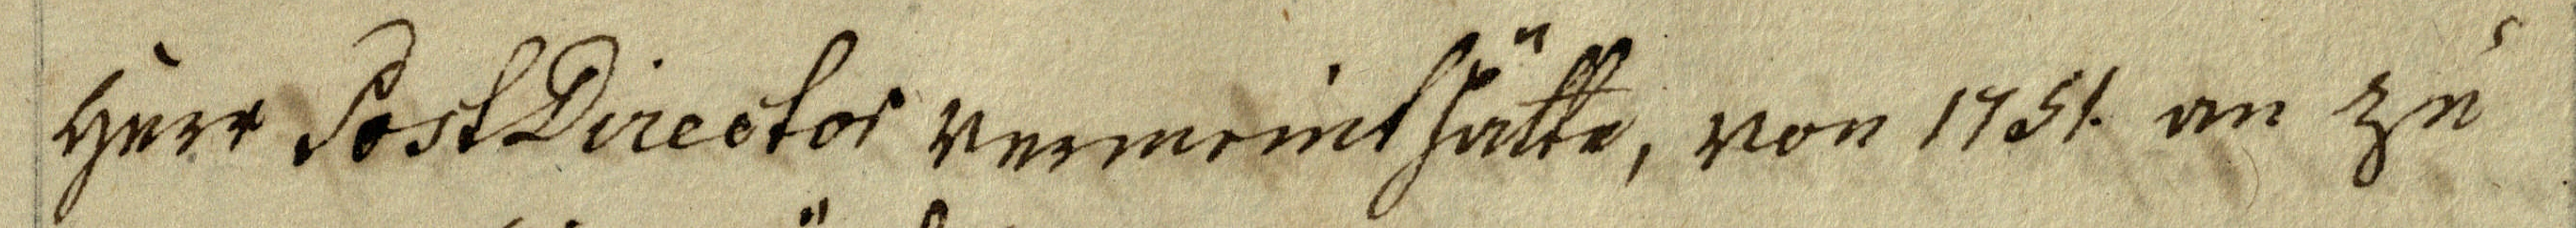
Herr Post Director vermeint hätte, von 1751 an zu
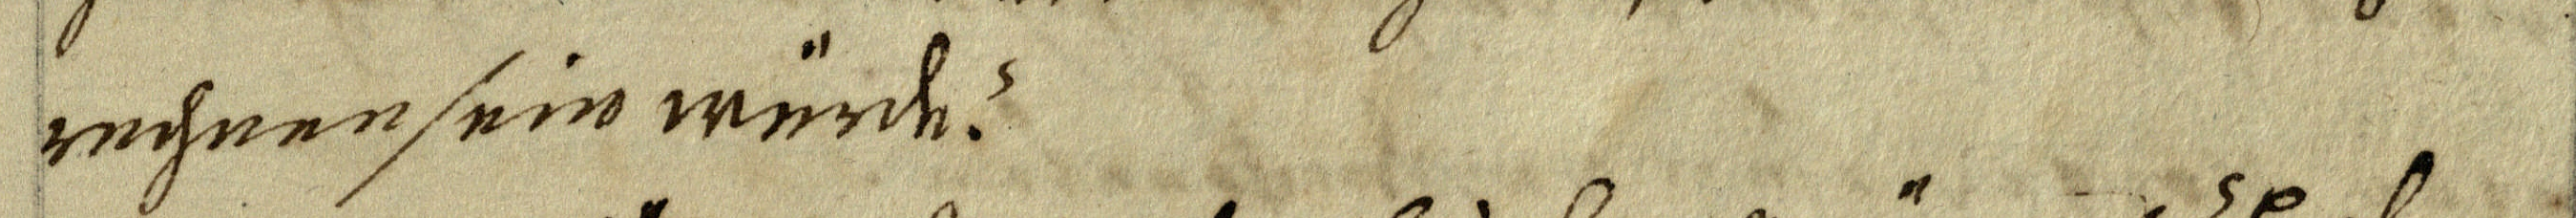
rechnen sein würde?
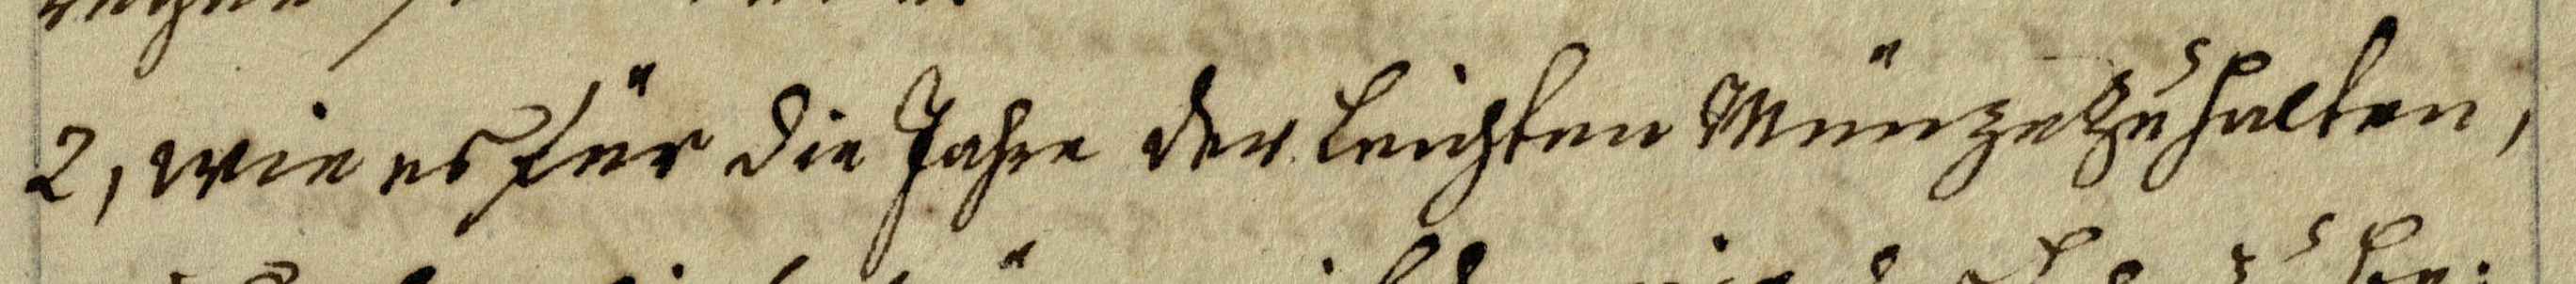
2, wie es für die Jahre der leichten Münze zu halten,
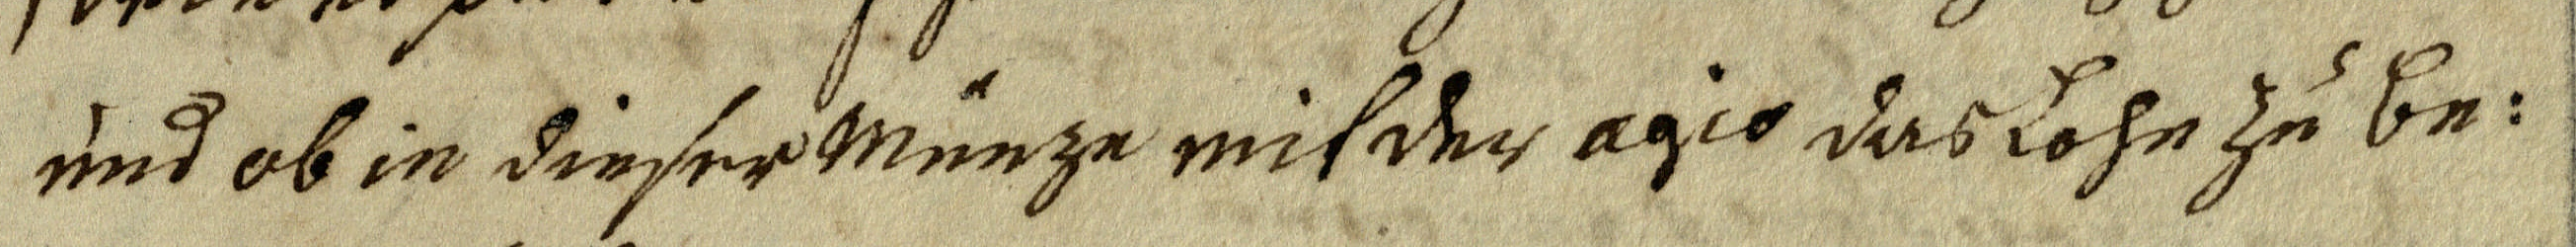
und ob in dieser Münze mit der agio das Lohn zu be¬
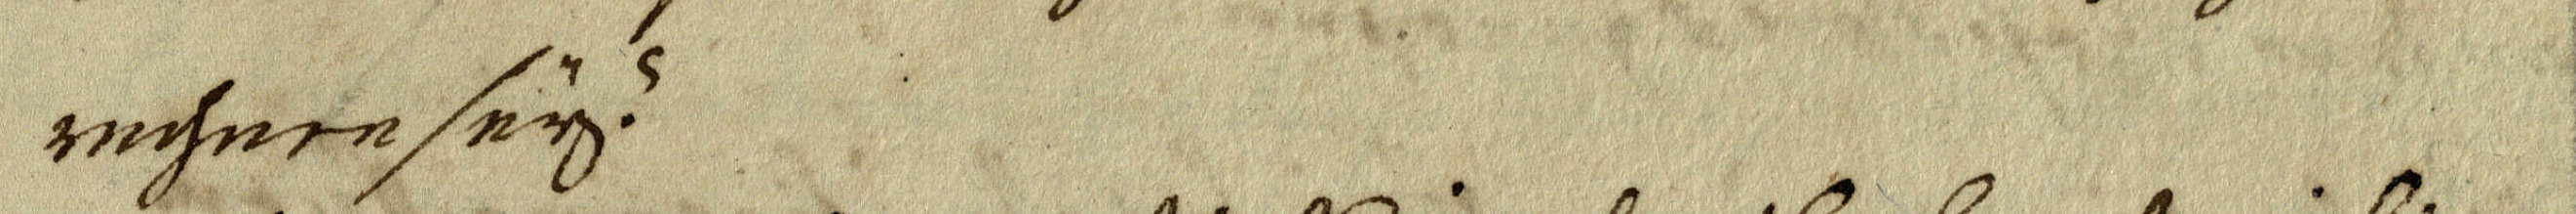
rechnen seÿ?
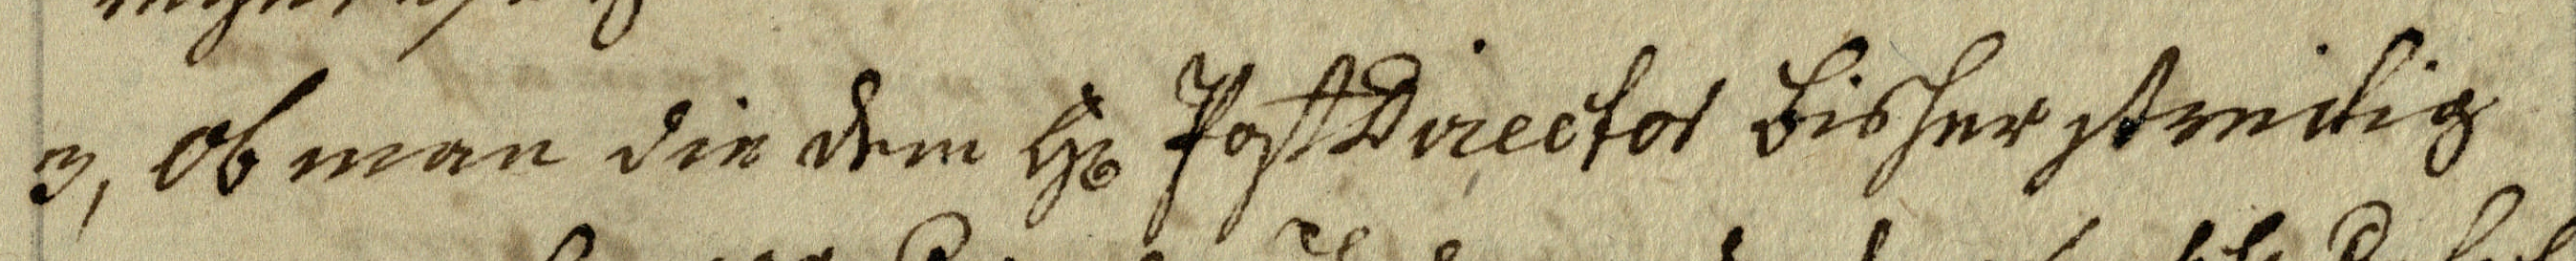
3, ob man die dem H. PostDirector bisher streitig
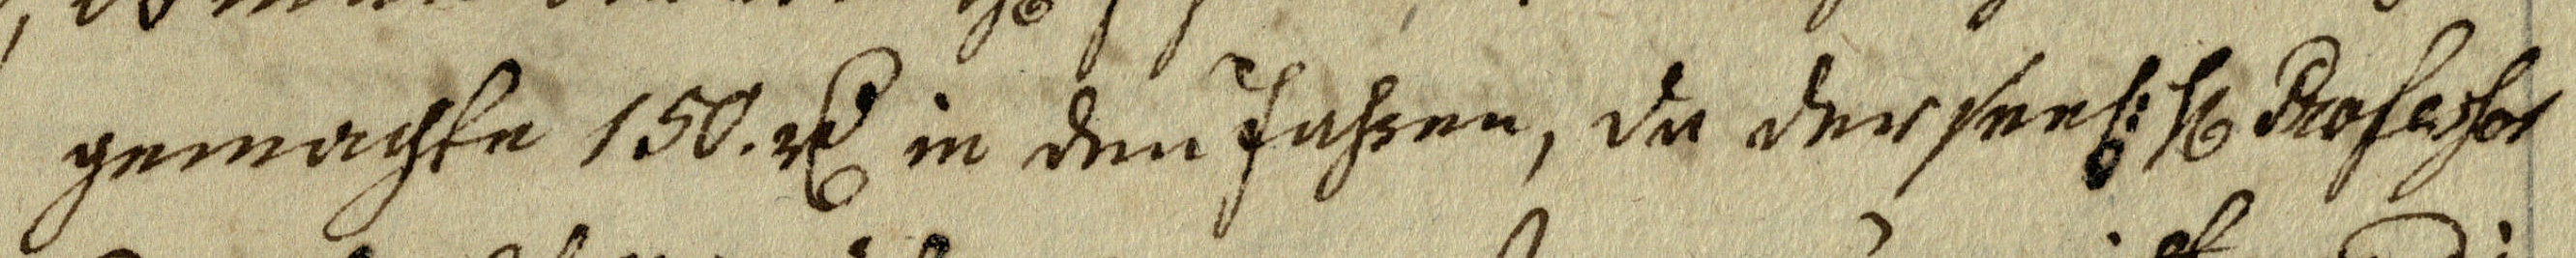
gemachte 150 rt. in den Jahren, da der Seel. H. Professor
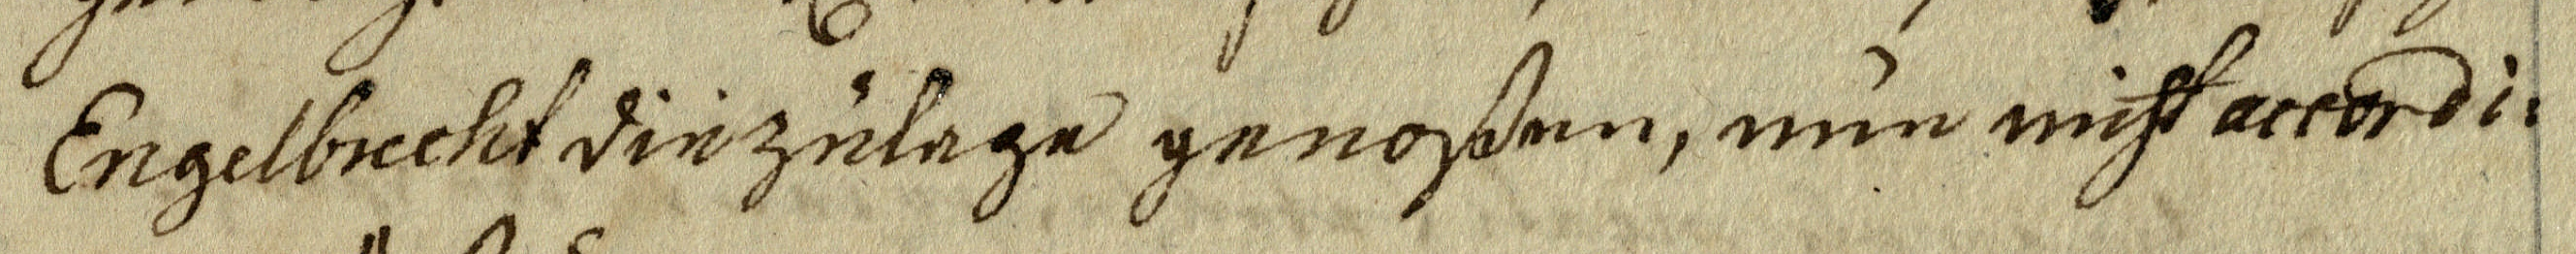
Engelbrecht die Zulage genoßen, nun nicht accordi¬
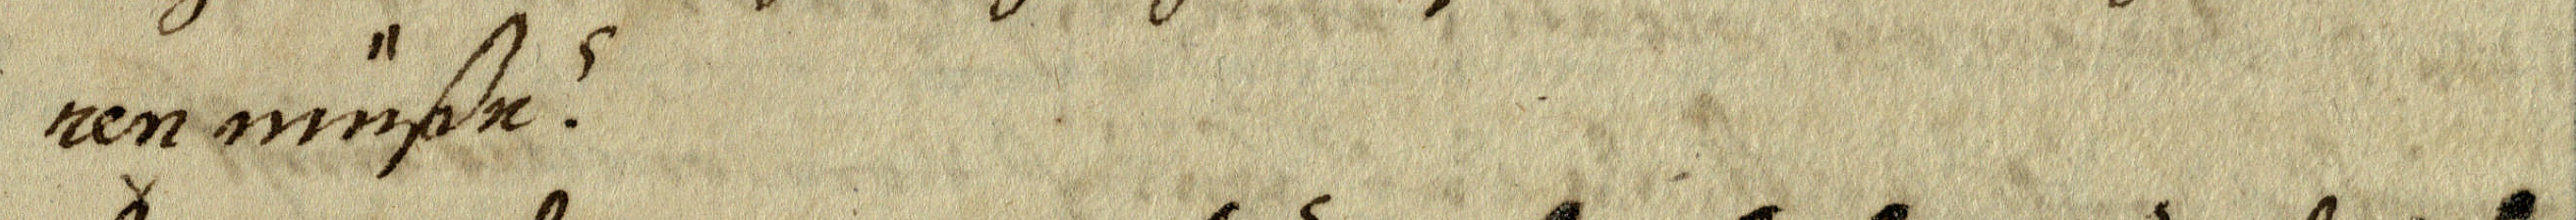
ren müße?
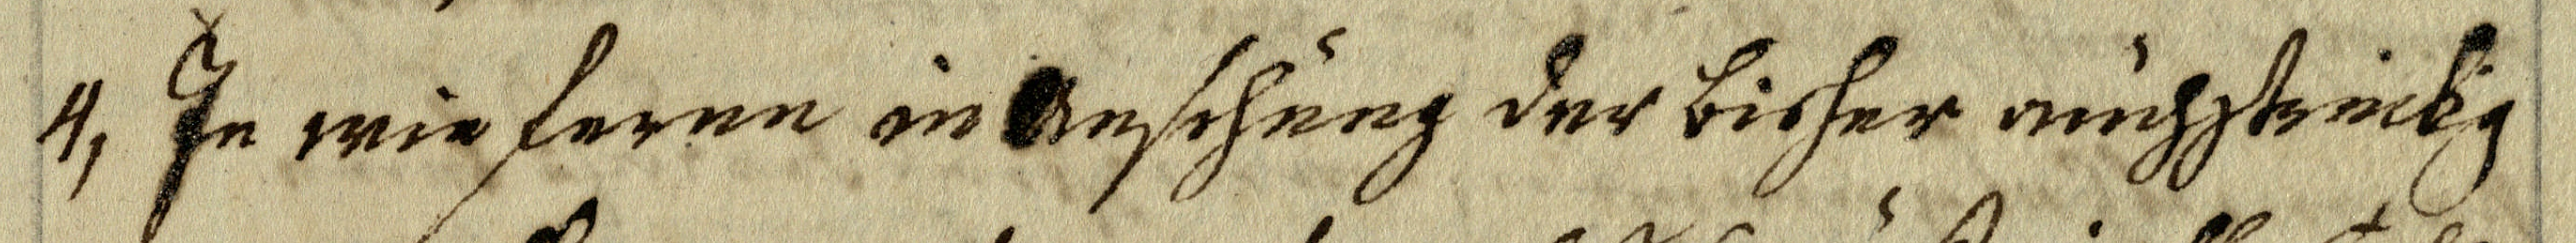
4, In wie ferne in Ansehung der bisher auch streitig
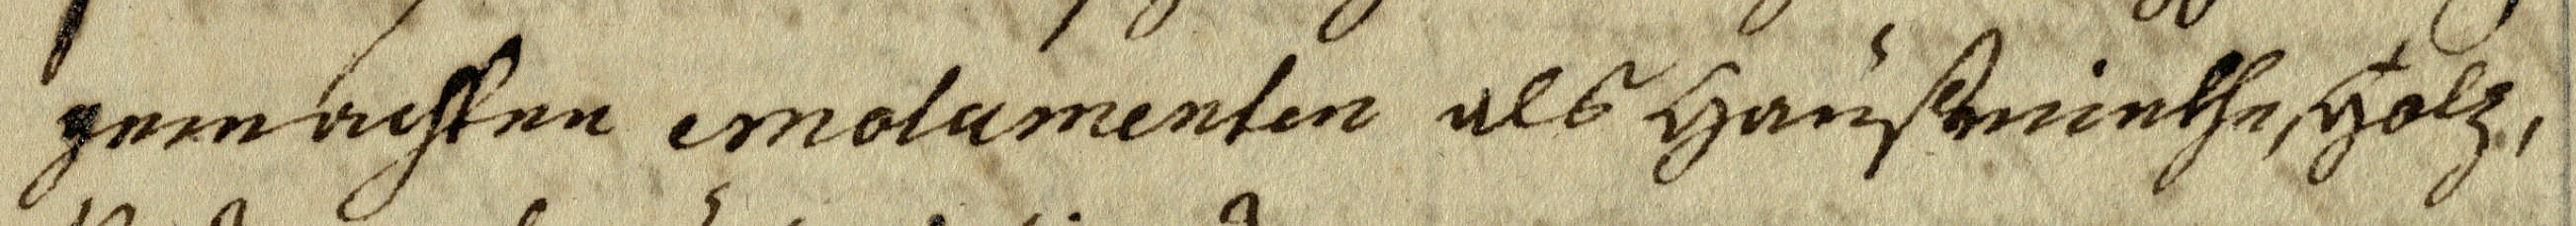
gemachten emolumenten als Hausmiethe, Holz,
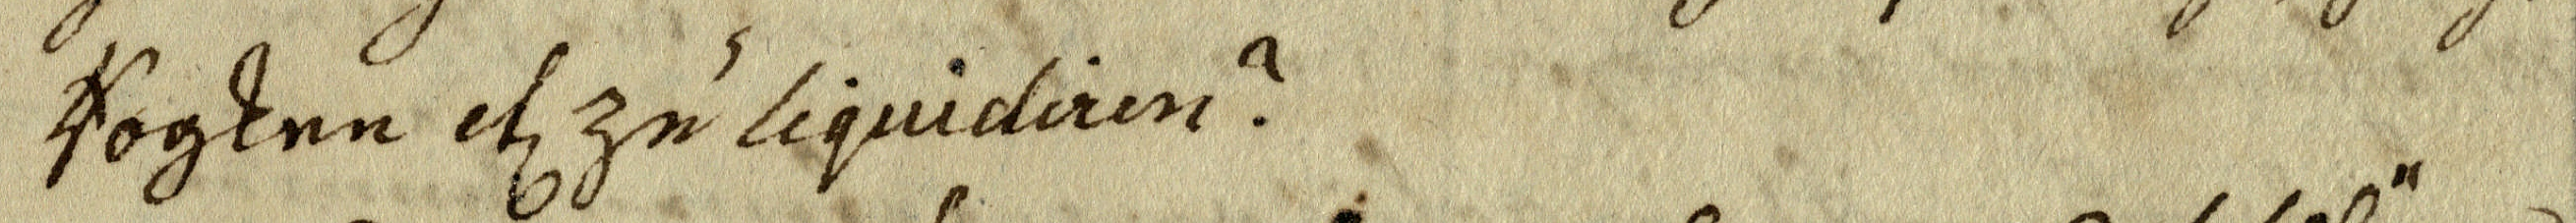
Rogken et. zu liquidiren?
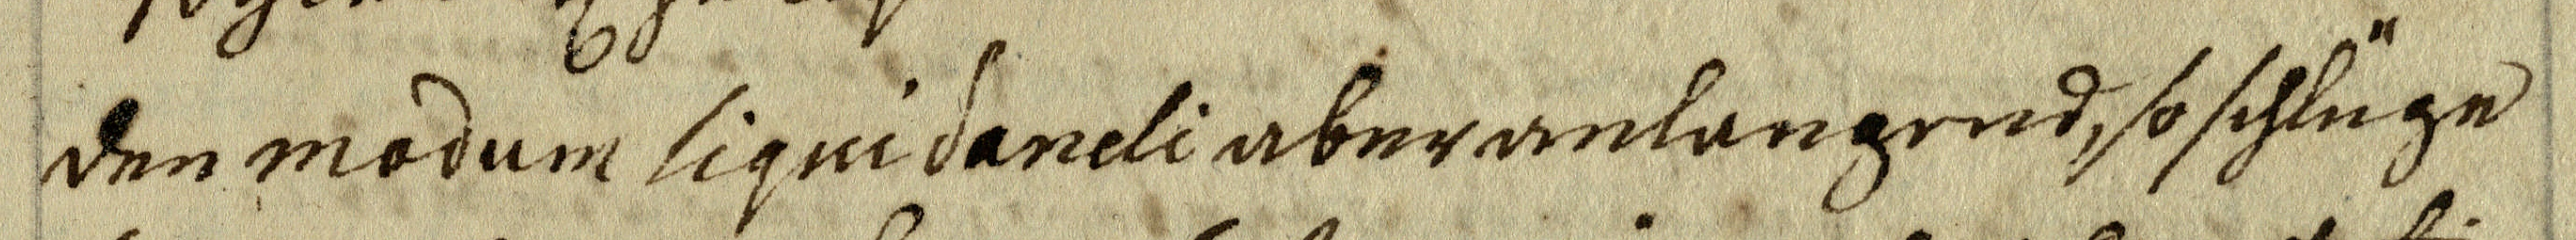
Den modum liquidandi aber anlangend, so schlüge
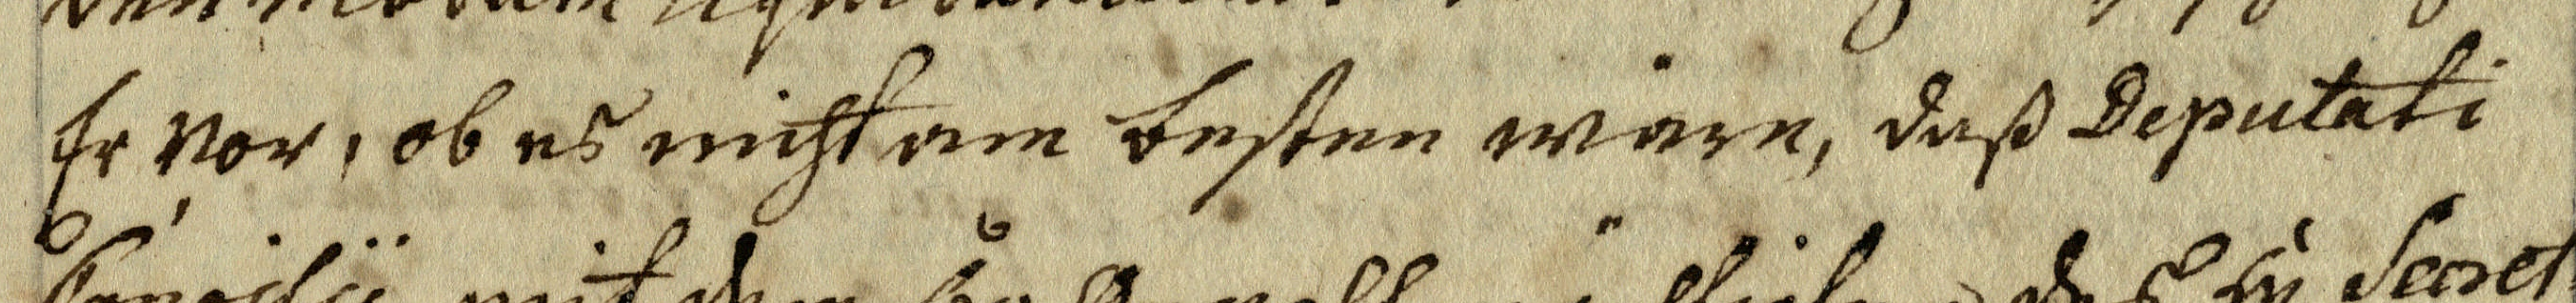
Er vor, ob es nicht am besten wäre, daß Deputati
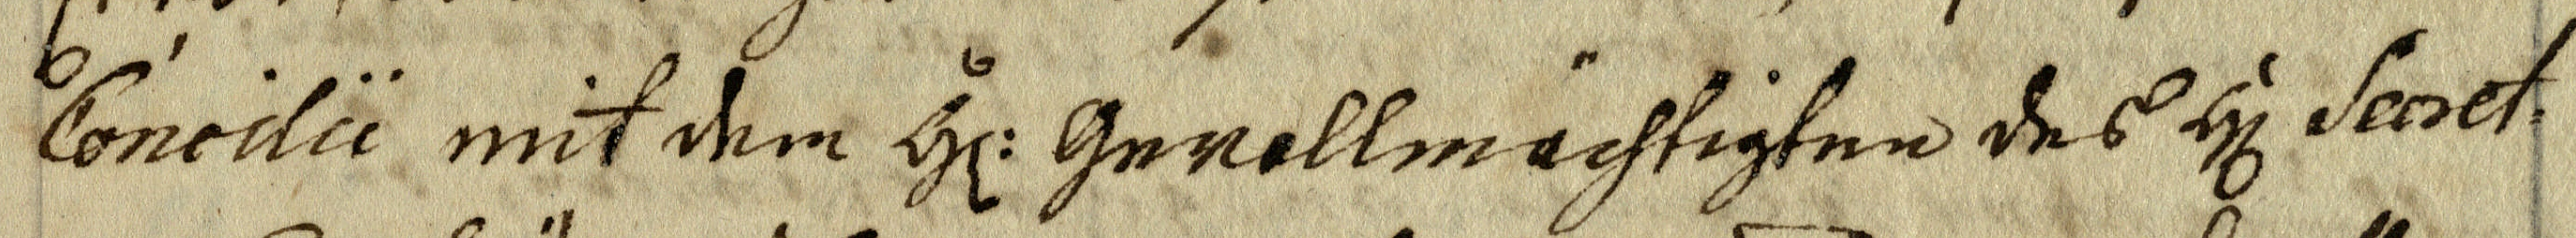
Concilii mit dem H. Gevollmächtigten des H. Secret.
